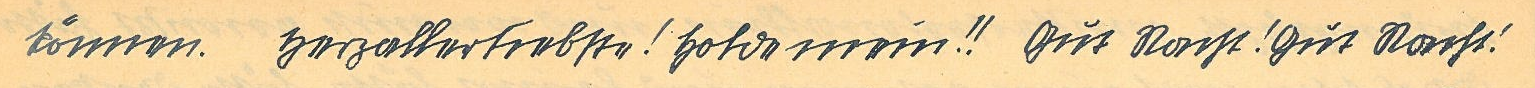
können. Herzallerliebste! Holde mein!! Gut Nacht! Gut Nacht!
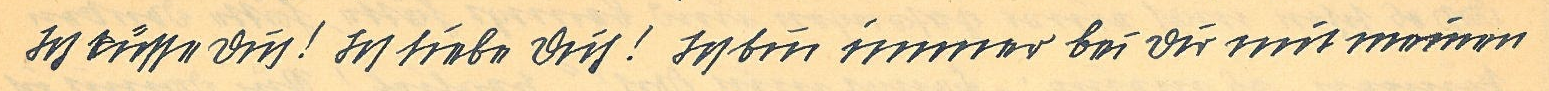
Ich küsse Dich! Ich liebe Dich! Ich bin immer bei Dir mit meinen
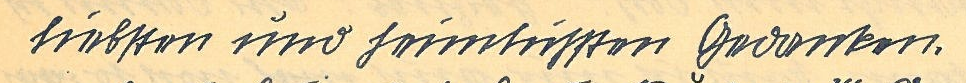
liebsten und heimlichsten Gedanken.
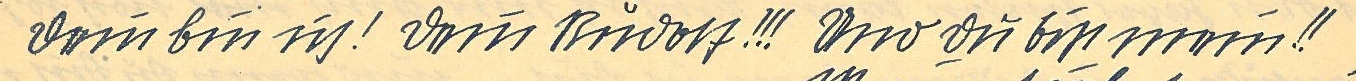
Dein bin ich! Dein !!! Und Du bist mein!!
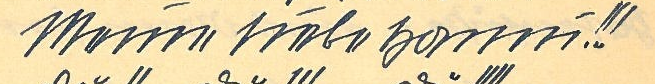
Meine liebe !!!
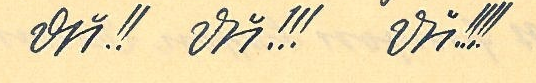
Du!! Du!!! Du!!!!
